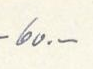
60
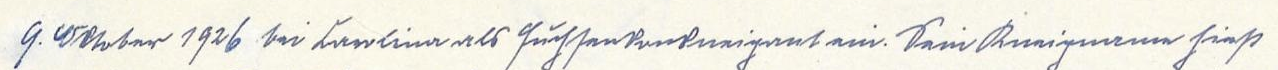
9. Oktober 1926 bei Carolina als Fuchsenkonkneipant ein. Seine Kneipname hieß
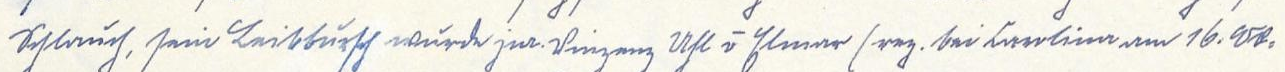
Schlauch, sein Leibbursch wurde jur. Vinzenz Uhl v/o Elmar (rez. bei Carolina am 16. Ok-
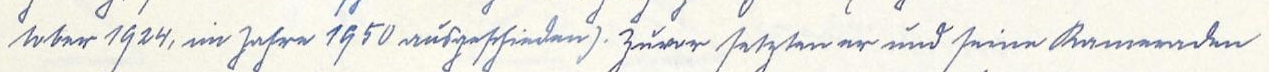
tober 1924, im Jahre 1950 ausgeschieden). Zuvor setzten er und seine Kameraden
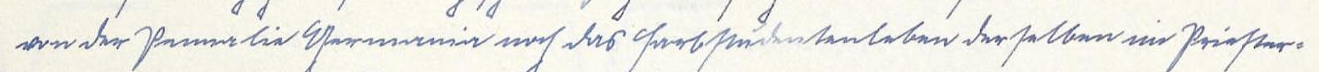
von der Pennalie Germania noch das Farbstudentenleben derselben im Priester-
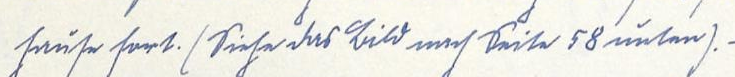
hause fort. (Siehe Bild auf Seite 58 unten).
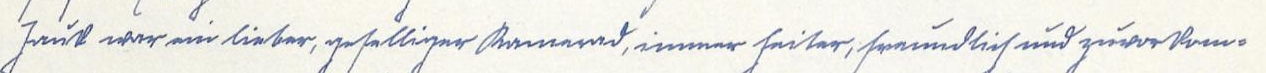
Jauk war ein lieber, geselliger Kamerad, immer heiter, freundlich und zuvorkom-
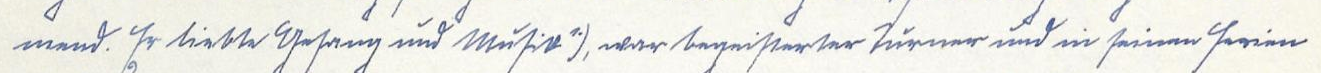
mend. Er liebte Gesang und Musik, war begeisterter Turner und in seinen Ferien
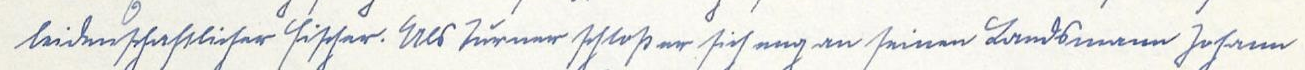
leidenschaftlicher Fischer. Als Turner schloß er sich eng an seinen Landsmann Johann
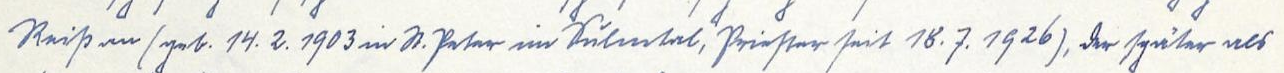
Reiß an (geb. 14.2.1903 in St. Peter im Sulmtal, Priester seit 18.7.1926), der später als
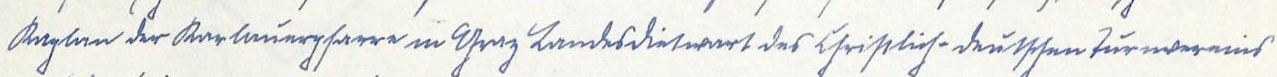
Kaplan der Karlunerpfarre (x) in Graz Landesdietwart des christlich-deutschen Turnvereins
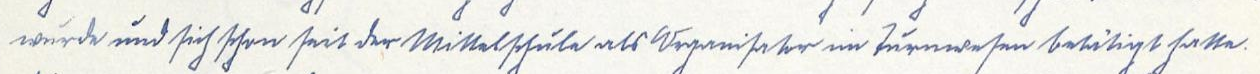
wurde und sich schon seit der Mittelschule als Organisator im Turnerwesen betätigt hatte.
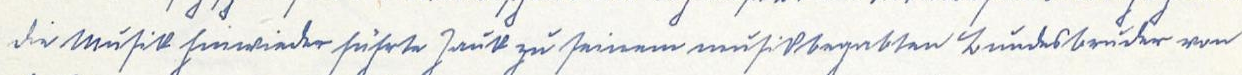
Die Musik hinwieder führte Jauk zu seinem musikbegabten Bundesbruder von
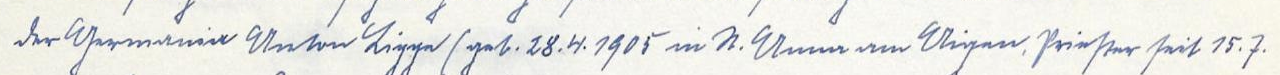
der Germania Anton Lippe (geboren 18.4.1905 in St. Anna am Aigen, Priester seit 15.7.
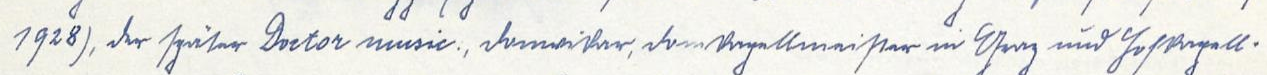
1928), der später Doctor music., Domvikar, Domkapellmeister in Graz und Hofkapell-
